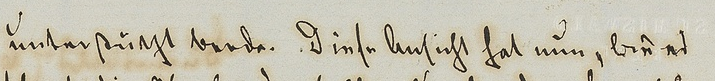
unterstützt werde. Diese Ansicht hat nun, wie es
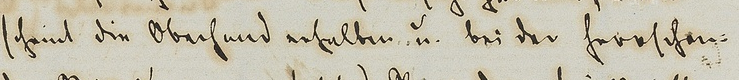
scheint die Oberhand erhalten u. bei der herrschen-
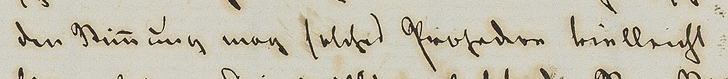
den Stimmung mag solches Prozedere vielleicht
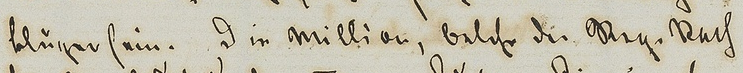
klüger sein. Die Million, welche der Reg.Rath
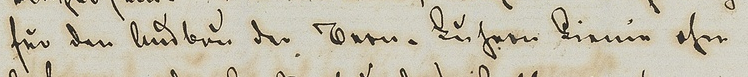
für den Ausbau der Bern–Luzern Linie ohne
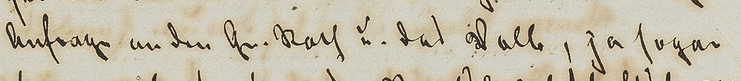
Anfrage an den Gr. Rath u. das Volk, ja sogar
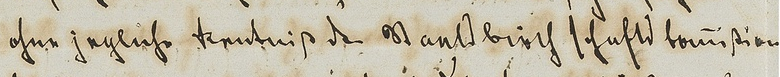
ohne jegliche Kenntniß der Staatswirthschaftskommißion
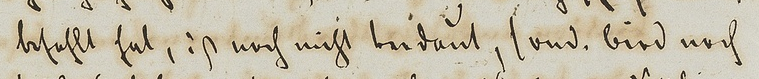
bezahlt hat, ist noch nicht verdaut, sond. wird noch
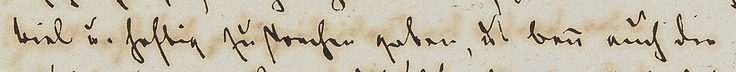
viel u. heftig zu sprechen geben, u. wenn auch die
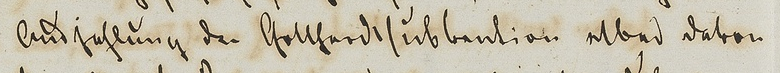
Auszahlung der Gotthardtsubvention etwas davon
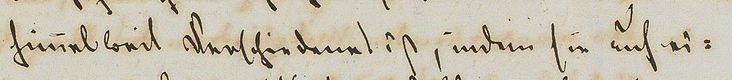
himmelweit Verschiedenes ist, indem sie auf ei-
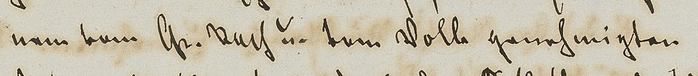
nem vom Gr. Rath u. vom Volk genehmigten
